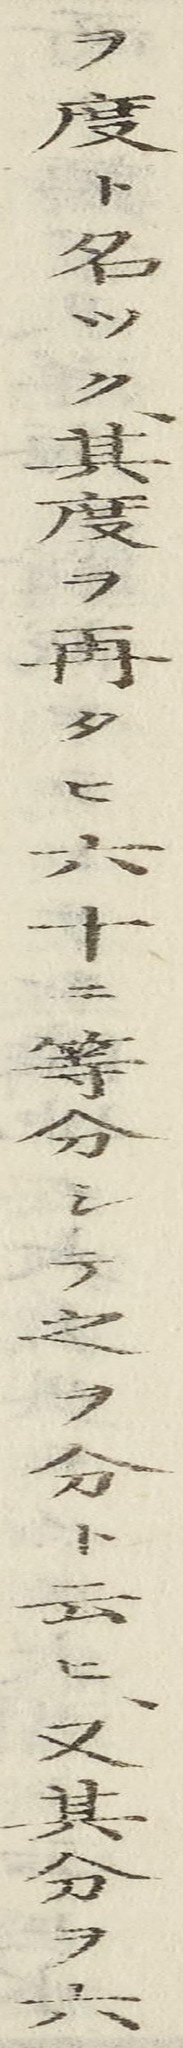ヲ度ト名ツク、其度ヲ再タヒ六十二等分シテ之ヲ分ト云ヒ、又其分ヲ六
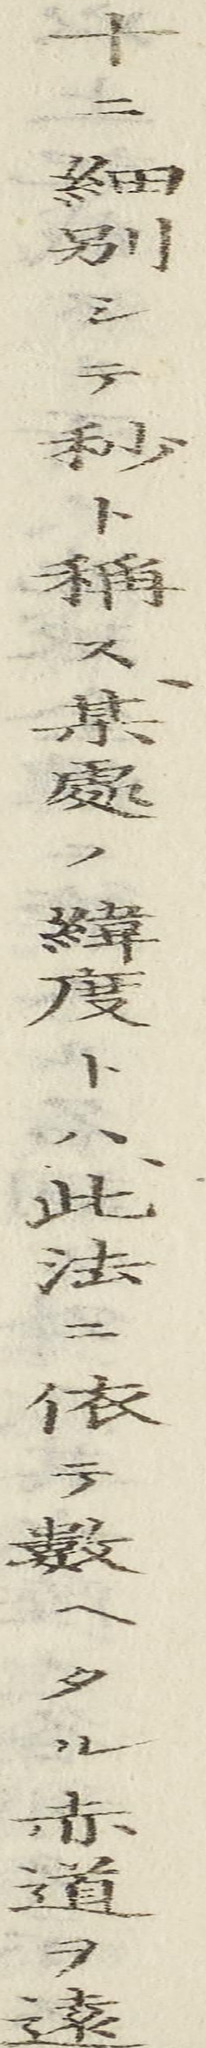十ニ細別シテ秒ト称ス、某処ノ緯度トハ、此法ニ依テ数ヘタル赤道ヲ遠
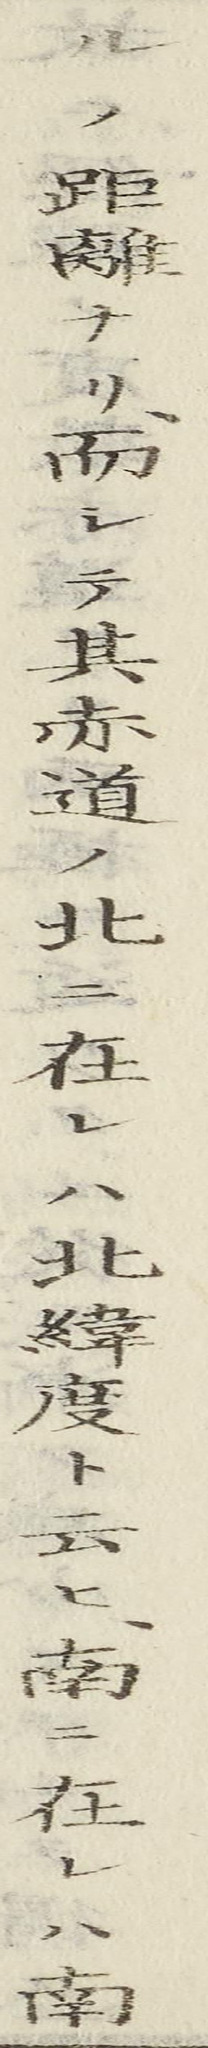ルノ距離ナリ、而シテ其赤道ノ北ニ在レハ北緯度ト云ヒ、南ニ在レハ南
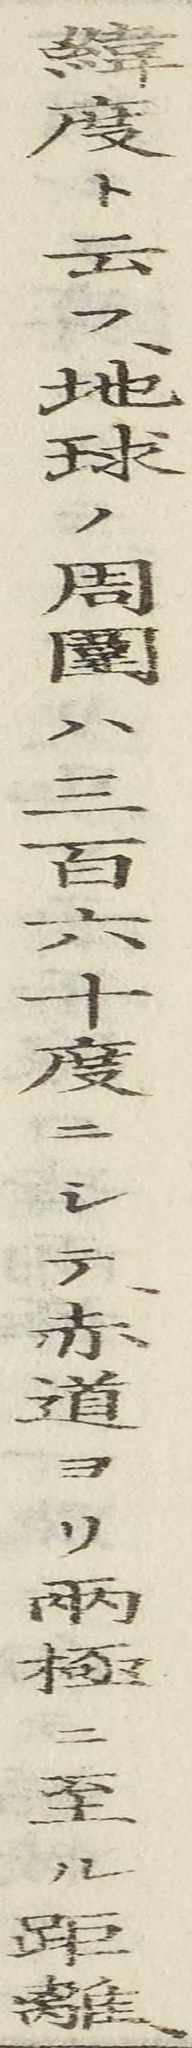緯度ト云フ、地球ノ周囲ハ三百六十度ニシテ、赤道ヨリ両極ニ至ル距離、
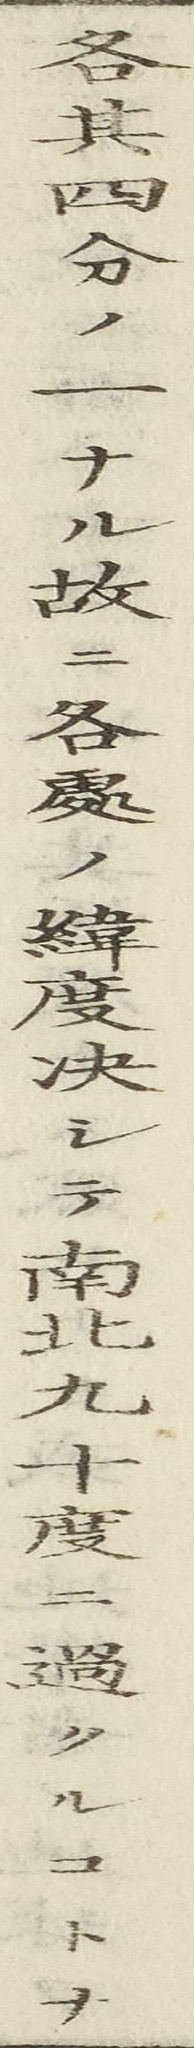各其四分ノ一ナル故ニ各処ノ緯度決シテ南北九十度ニ過クルコトナ
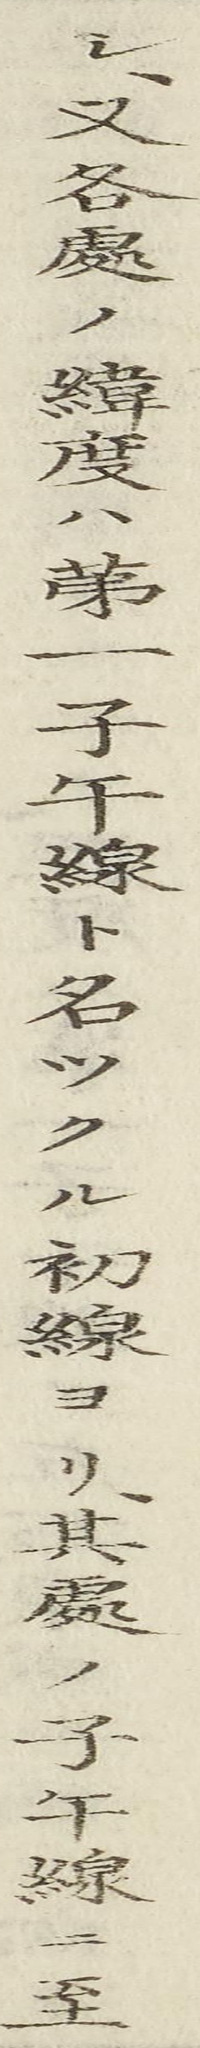シ、又各処ノ緯度ハ第一子午線ト名ツクル初線ヨリ、其処ノ子午線ニ至
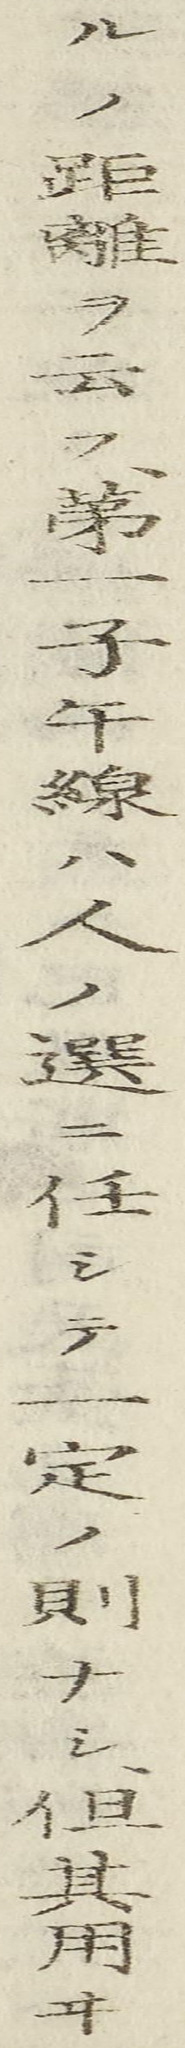ルノ距離ヲ云フ、第一子午線ハ人ノ選ニ任シテ一定ノ則ナシ、但其用ヰ
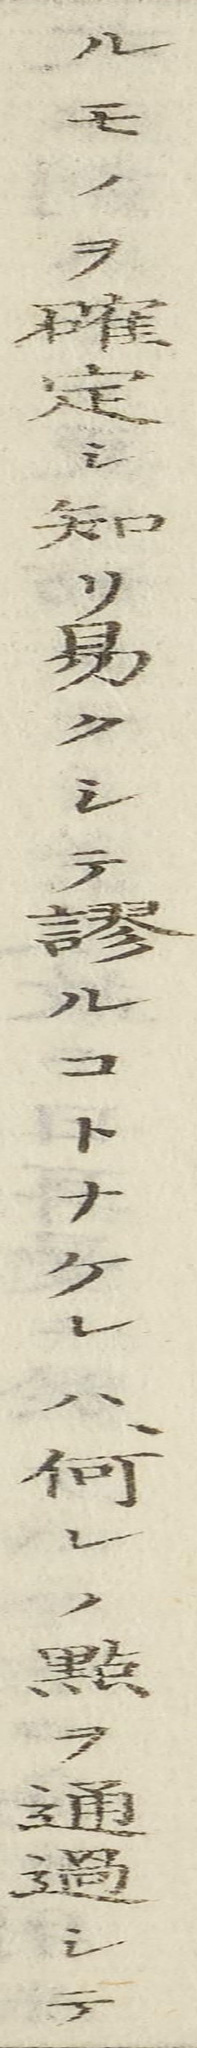ルモノヲ確定シ知リ易クシテ謬ルコトナケレハ、何レノ点ヲ通過シテ

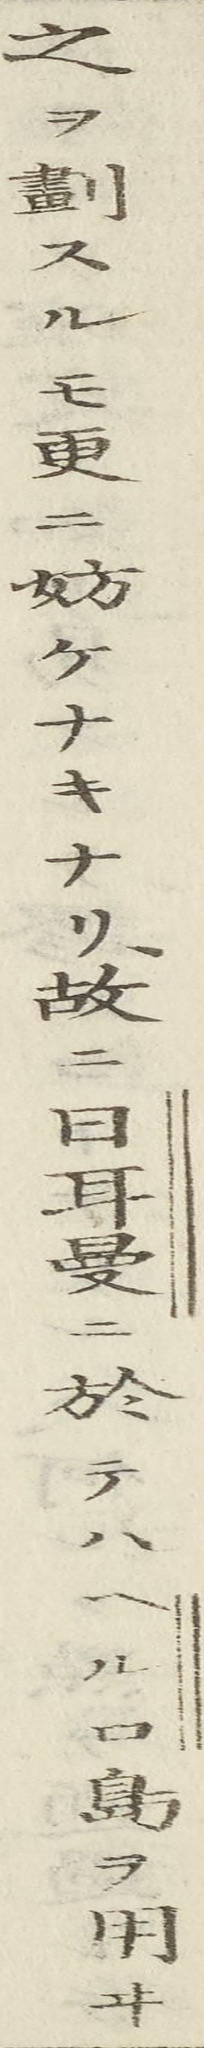之ヲ劃スルモ更ニ妨ケナキナリ、故ニ日耳曼ニ於テハヘルロ島ヲ用ヰ
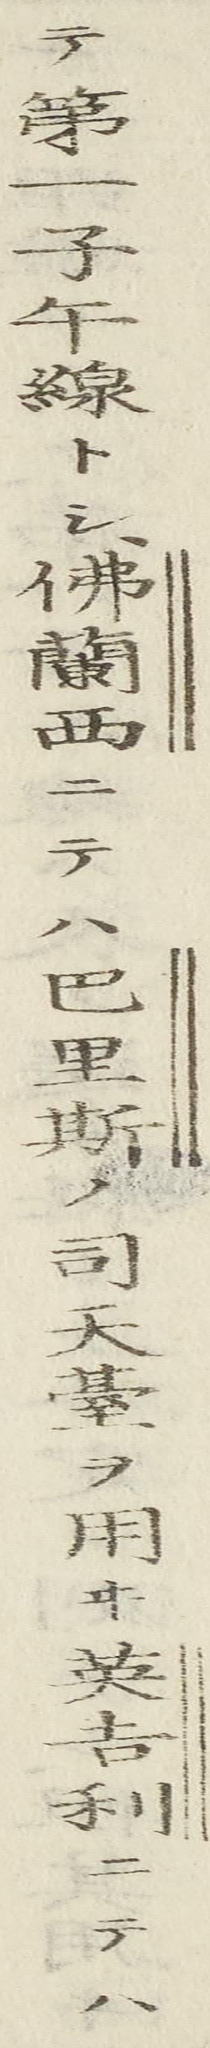テ第一子午線トシ、仏蘭西ニテハ巴里斯ノ司天台ヲ用ヰ英吉利ニテハ
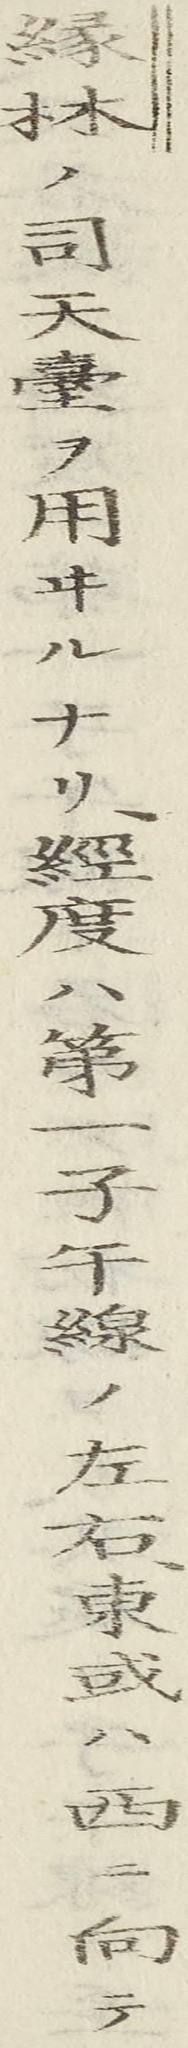縁林ノ司天台ヲ用ヰルナリ、経度ハ第一子午線ノ左右、東或ハ西ニ向テ
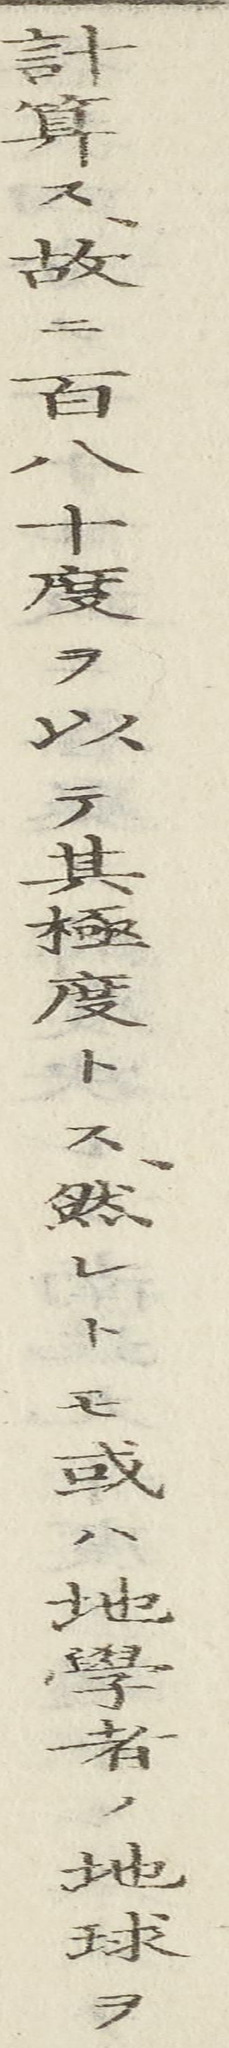計算ス、故ニ百八十度ヲ以テ其極度トス、然レトモ或ハ地学者ノ地球ヲ
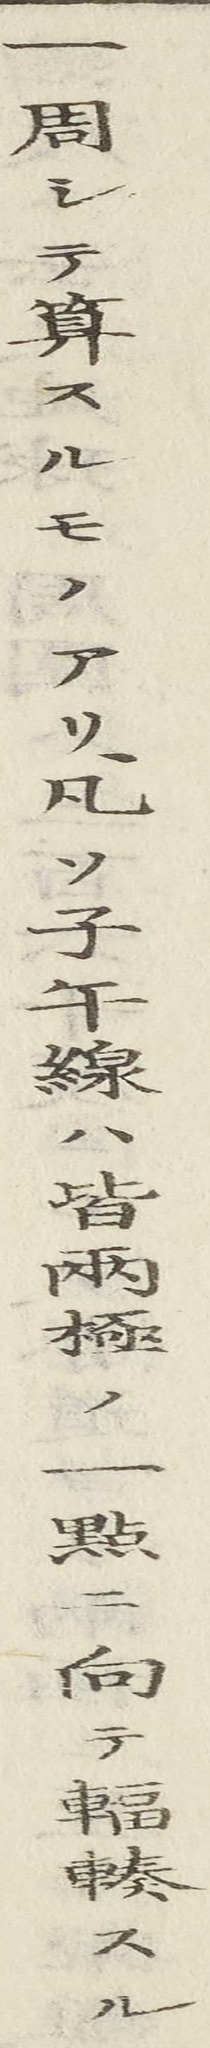一周シテ計算スルモノアリ、凡ソ子午線ハ皆両極ノ一点ニ向テ輻輳スル
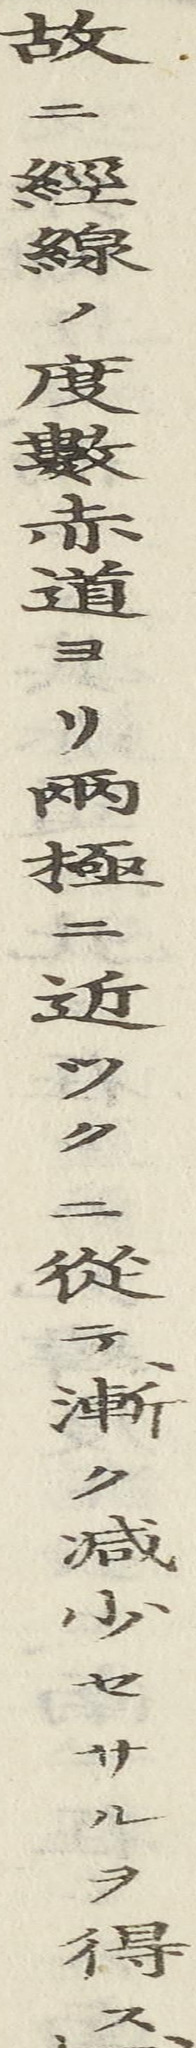故ニ経線ノ度数赤道ヨリ両極ニ近ツクニ従テ、漸ク減少セサルヲ得ス、」
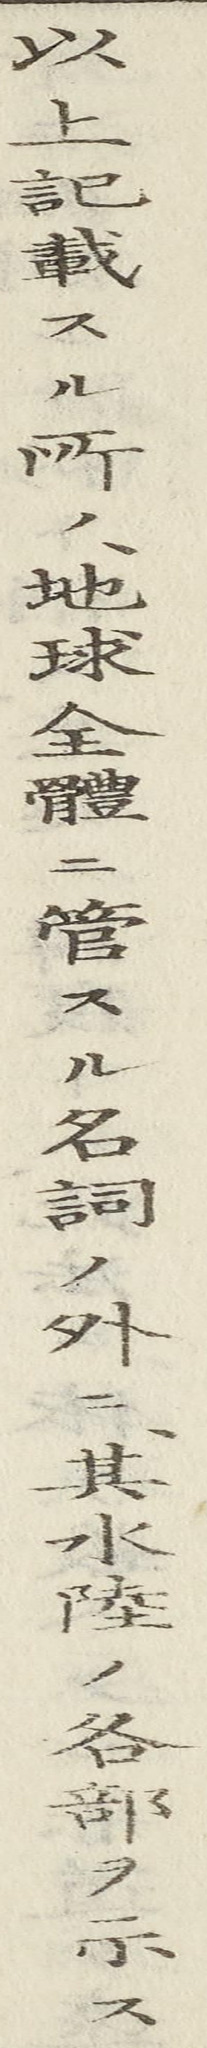以上記載スル所ノ、地球全体ニ管スル名詞ノ外ニ、其水陸ノ各部ヲ示ス
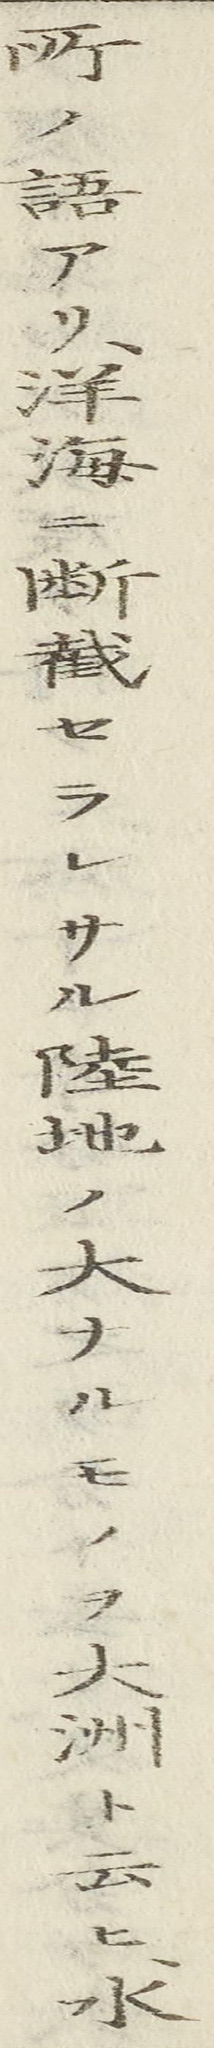所ノ語アリ、洋海ニ断裁セラレサル陸地ノ大ナルモノヲ大洲ト云ヒ、水
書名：百科全書　地文學　全
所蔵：東京大学地震研究所図書室 Earthquake Research Institute Library, The University of Tokyo, JAPAN
